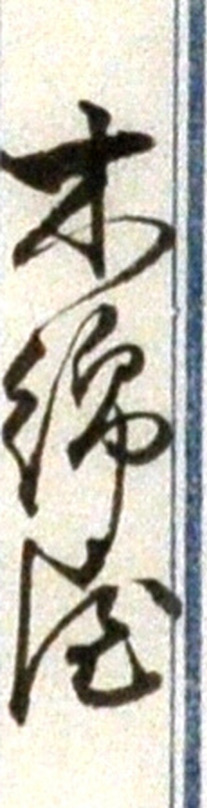木綿屋
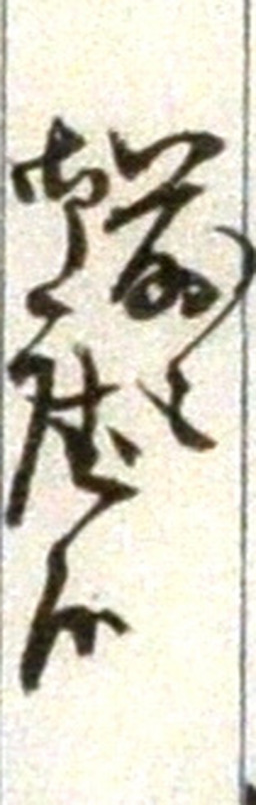御座候
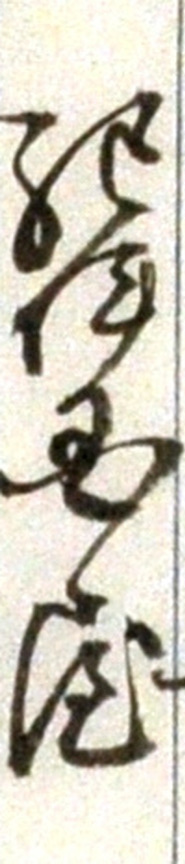紀伊国屋
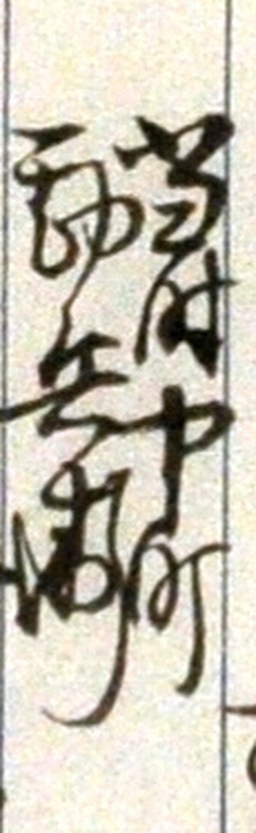勘兵衛
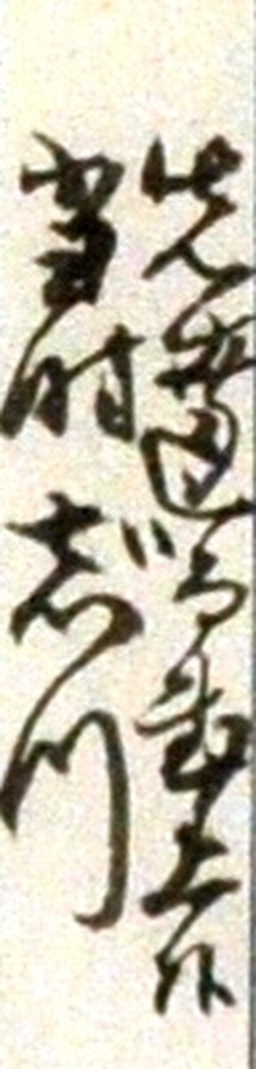当時じつ
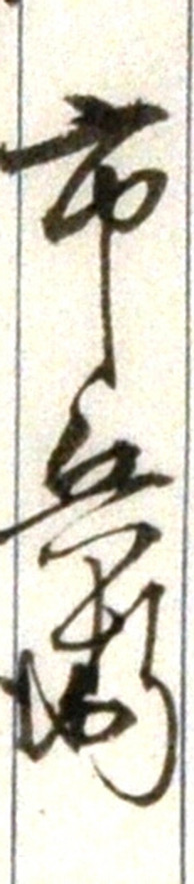勘兵衛
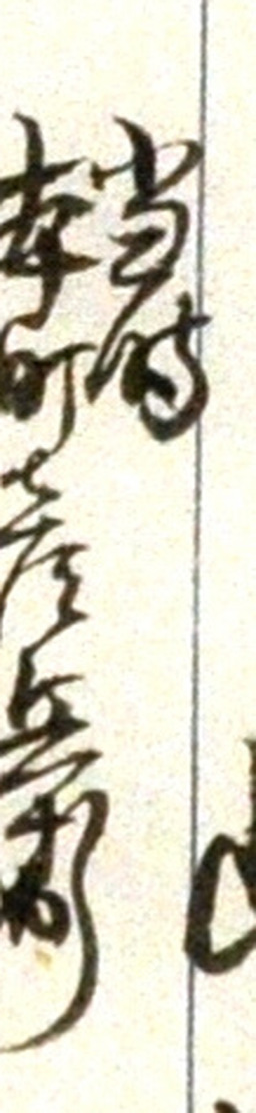本町彦兵衛
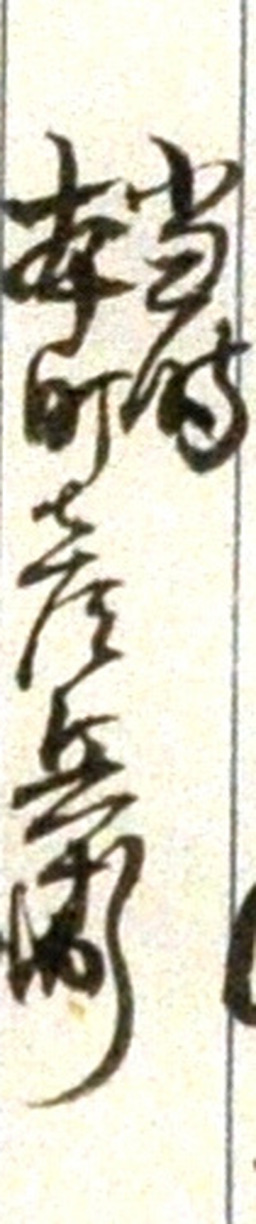本町彦兵衛
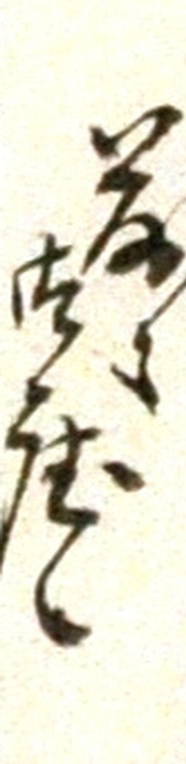御座候
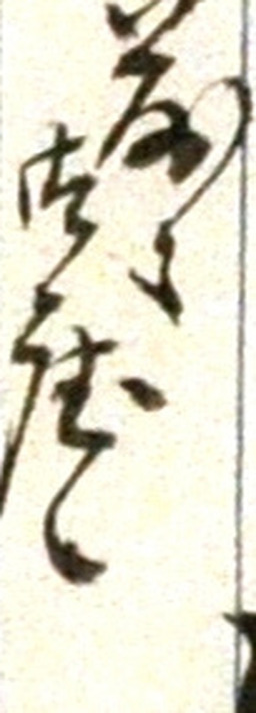御座候
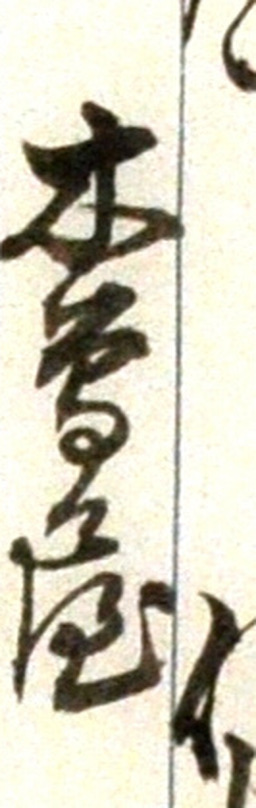木曽屋
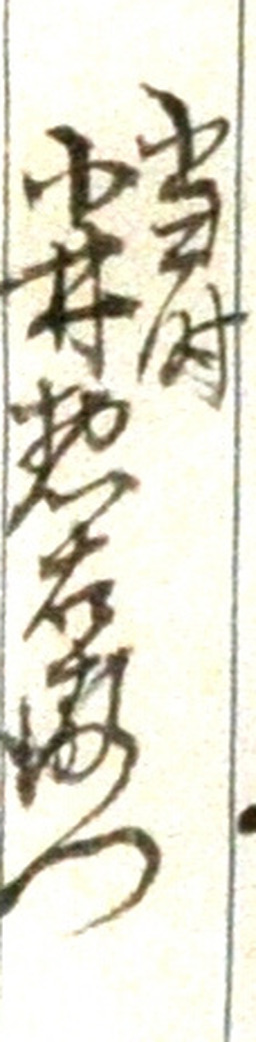小林惣右衛門

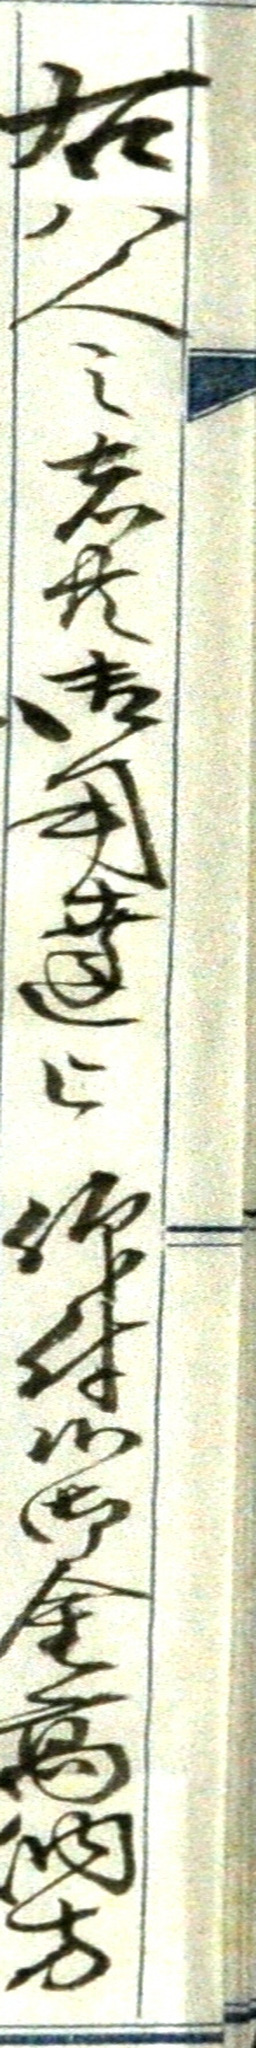右八人之者共御用達被仰付候御金高納方
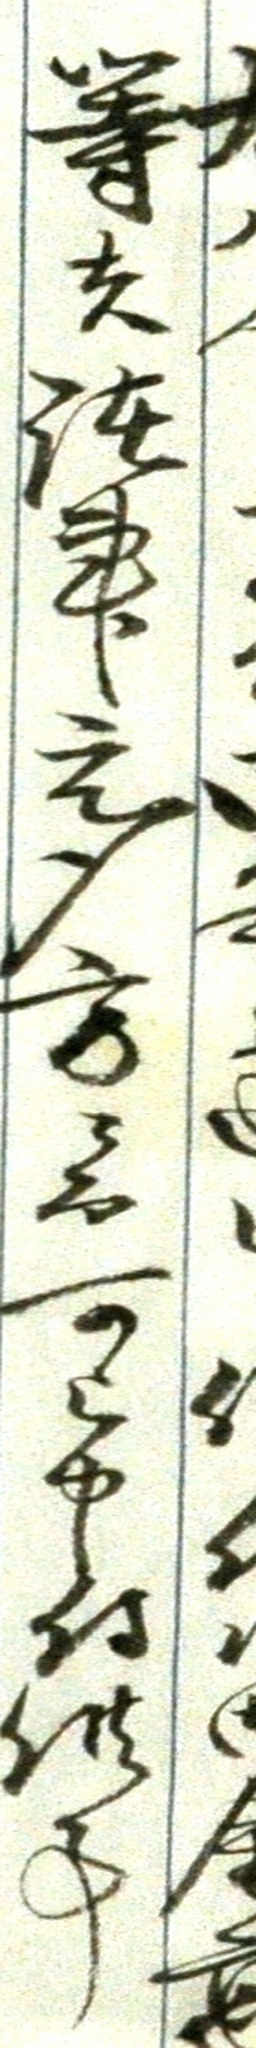等者諸事元〆方ニ而可被申付候事
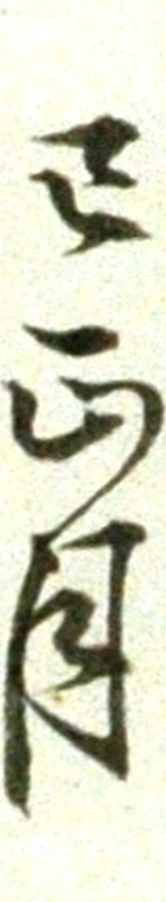巳正月
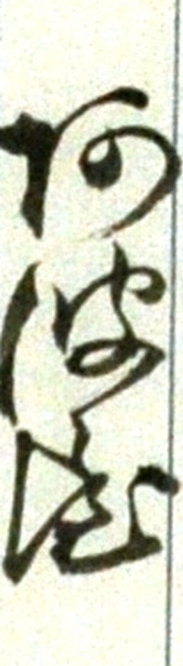阿波屋
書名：御拝地以来御用達相勤候者名前
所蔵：伊那市立高遠町図書館・合同会社AMANE
